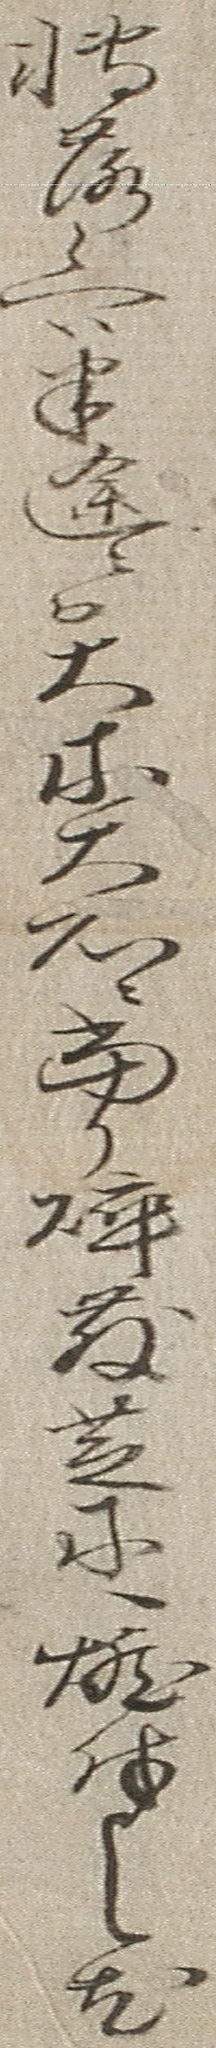転落候へは半途に而大木大石に当り砕散芝木へ燃付申候尤
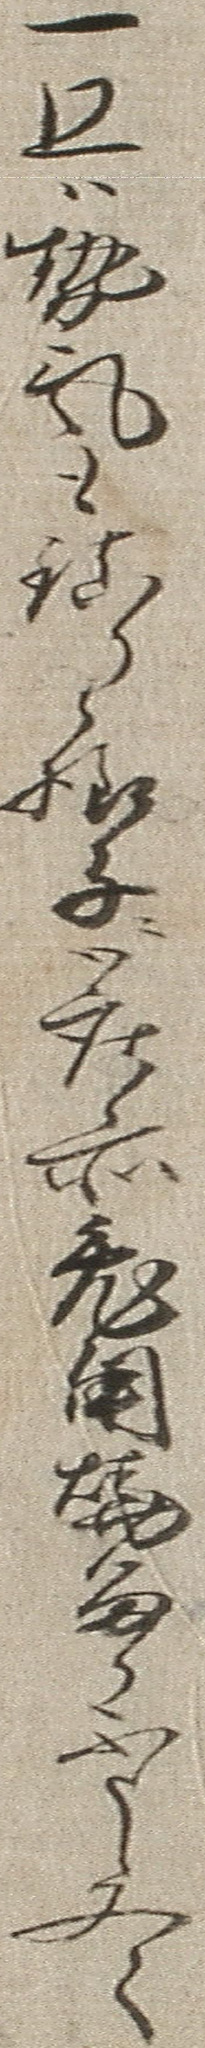一旦は勢気も鎮り候様子に御座候所兎角焼留り不申又々
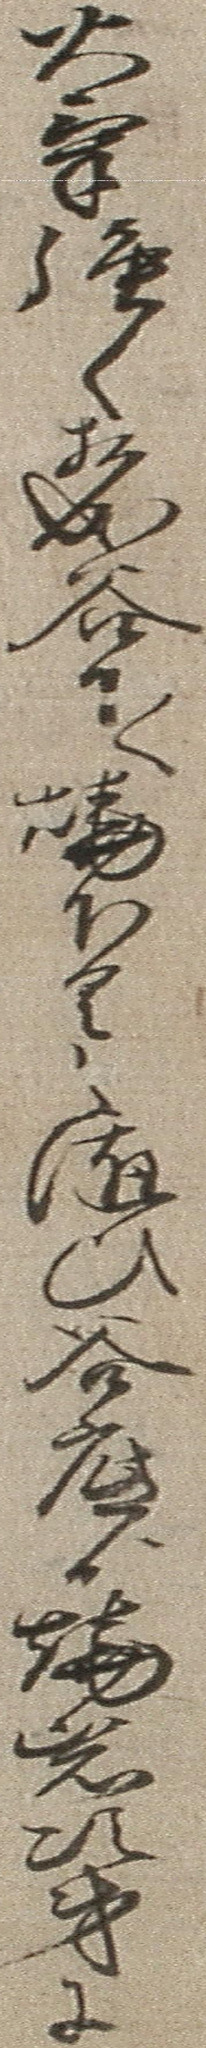火気強く相成谷下へ焼下り候随ひ谷底ゟ焼岩次第に
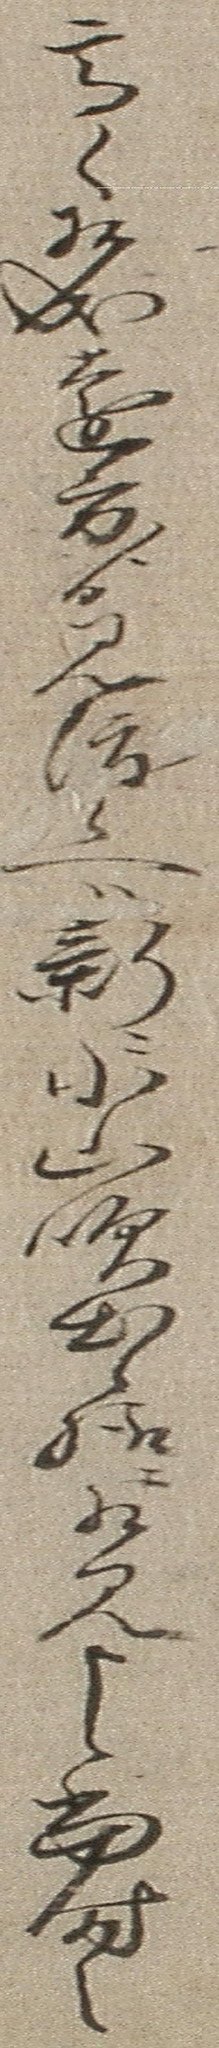高く相成遠方ゟ見渡候へは新に小山吹出候様二相見申候当時の
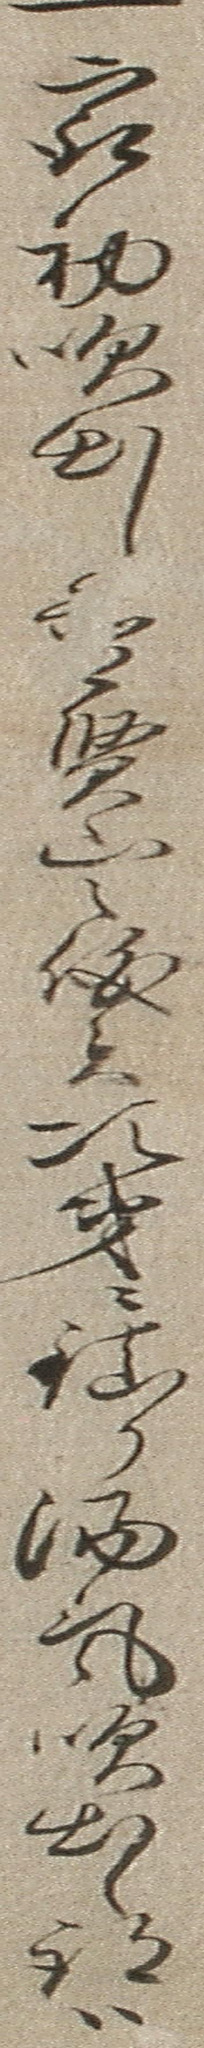一最初吹出し候普賢山之儀者次第に鎮り湯気吹出候跡は
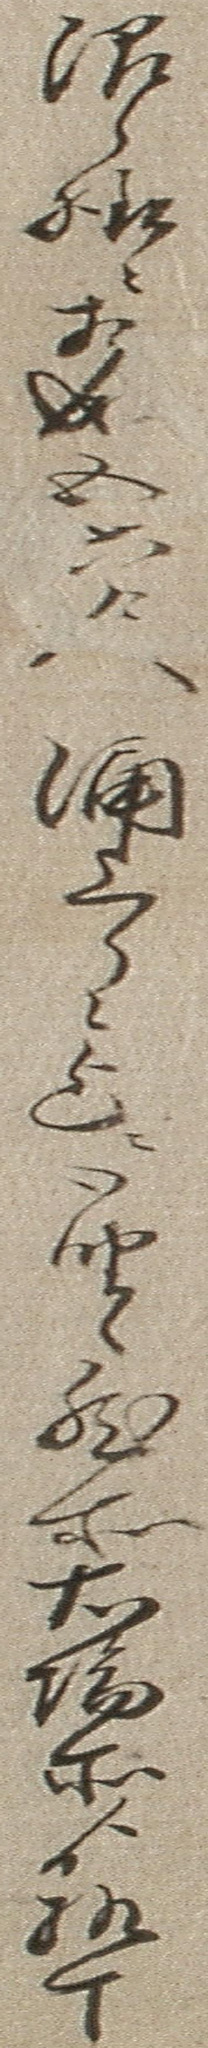沼之様に相成五六尺涌上り候迄に御座候然所右場所ゟ拾丁
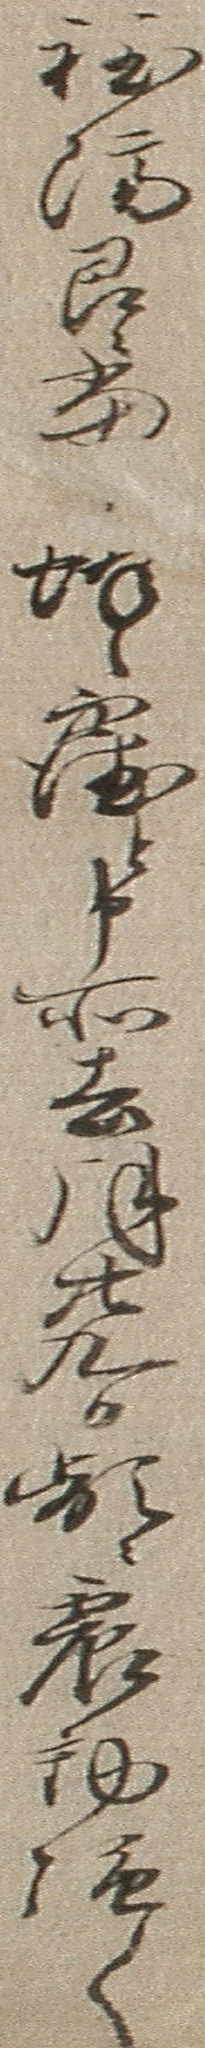程隔艮に当蜂之窪と申所去月廿九日頻に震動強く
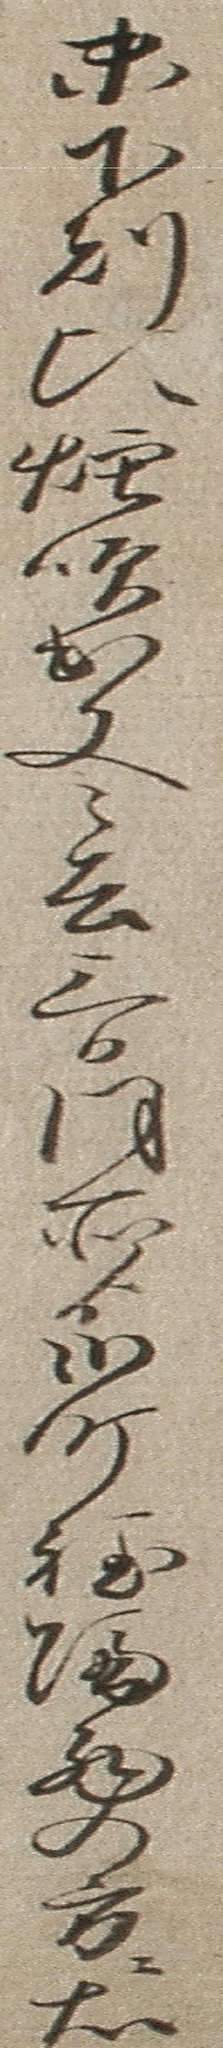未下刻頃煙吹出又々去三日同所ゟ弐町程隔西の方に右
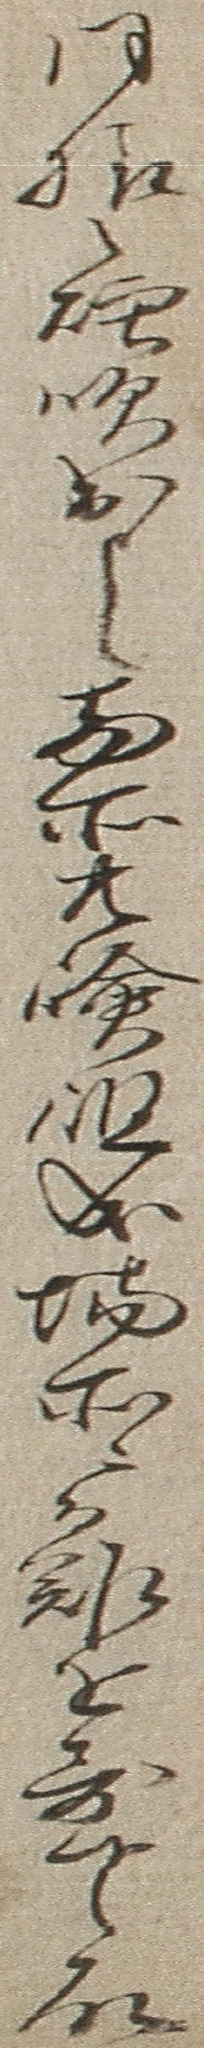同様之煙吹出申候両所共嶮岨成場所に而難近寄候之故
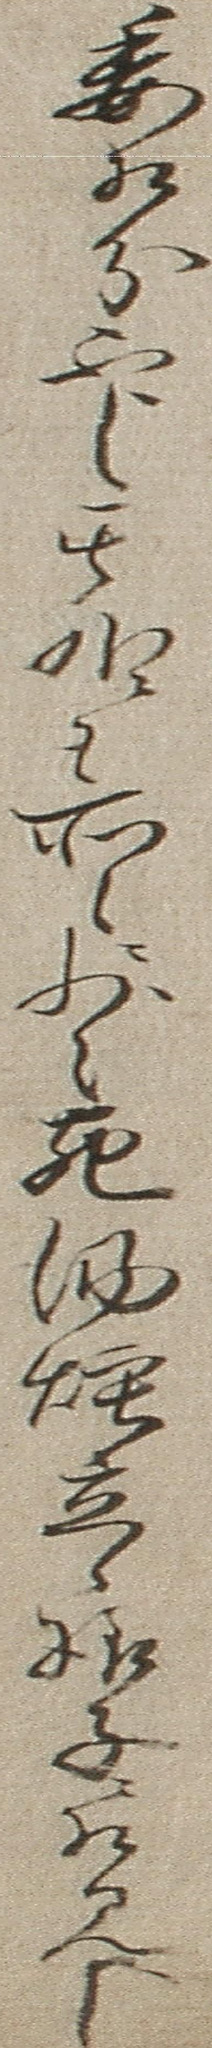委相分不申候其外にも所々に少し宛湯煙立候様子に相見へ申候

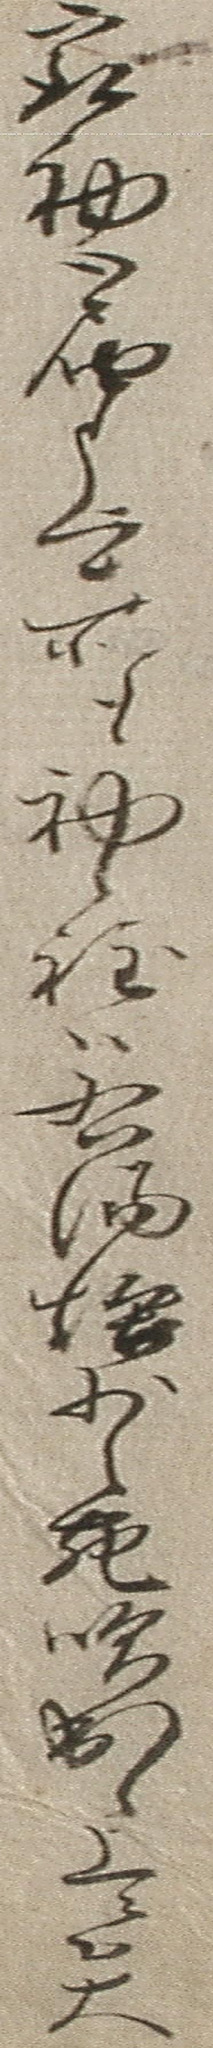最初御届申上候所も初之程は右湯煙少し宛吹出候上ニ而火
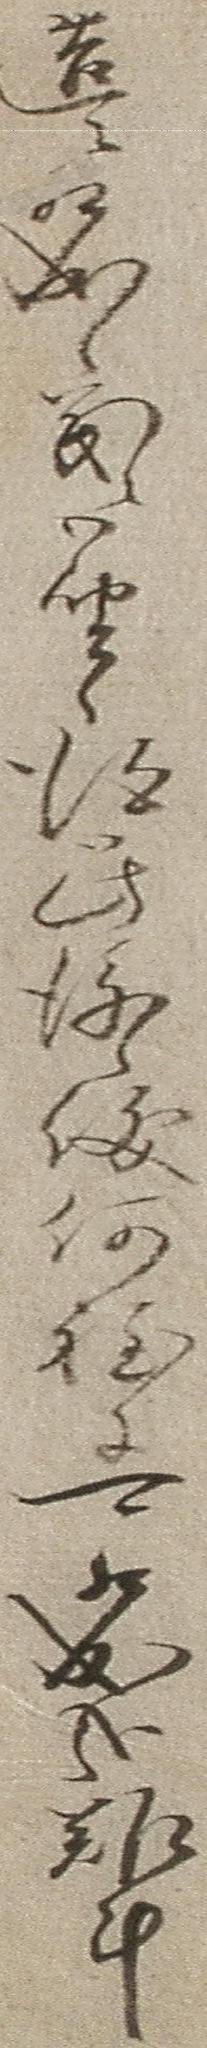道ニ相成候義ニ御座候得は此後之儀何程に可相成哉難計
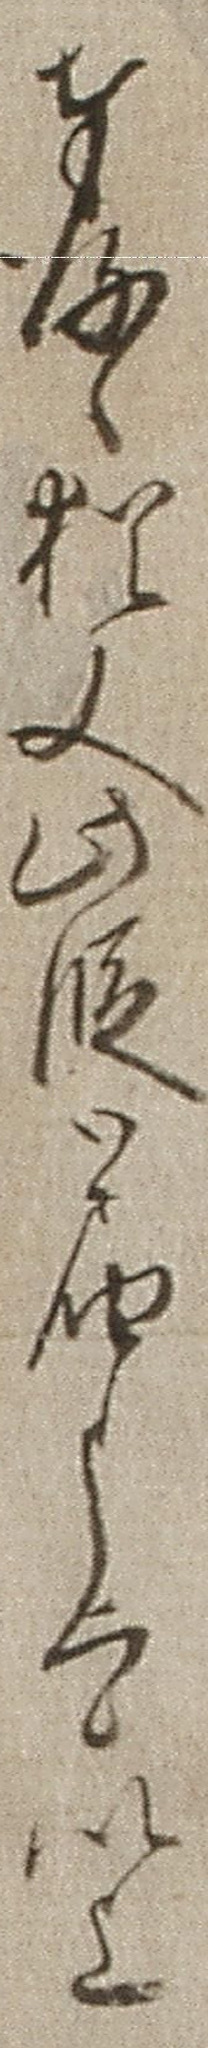奉存候猶又此段御届申上候以上
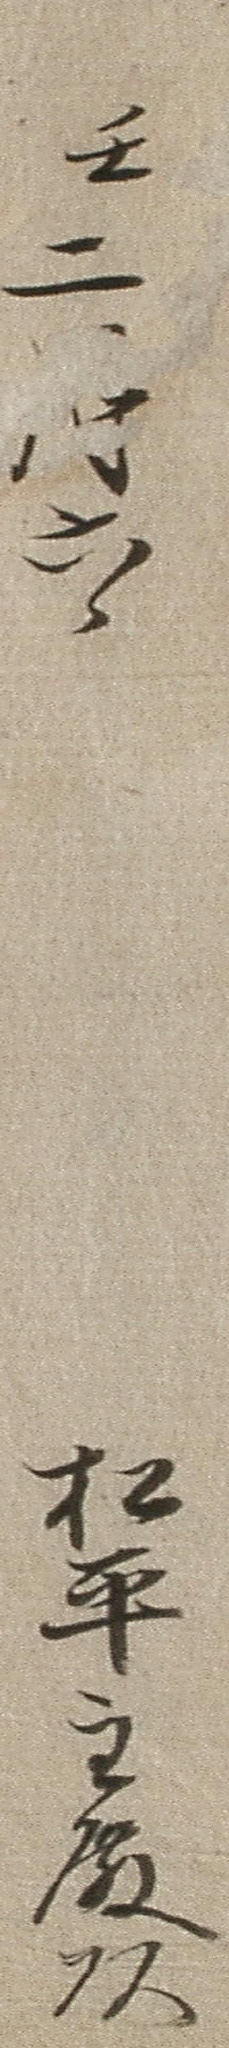閏二月六日松平主殿頭
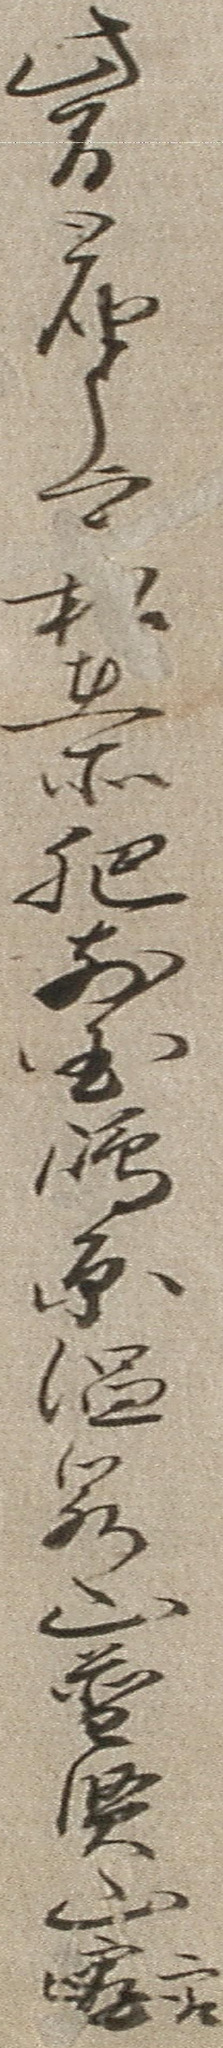此間御届申上候私在所肥前国嶋原温泉山普賢山最
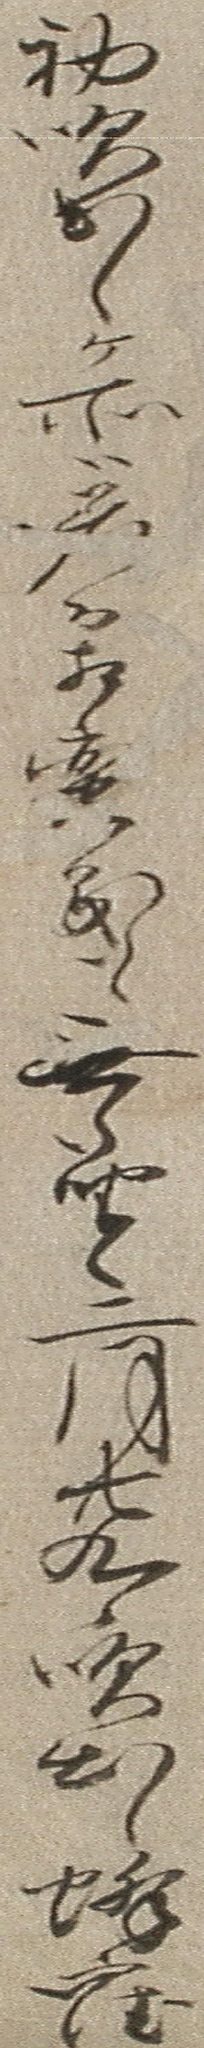初吹出候ケ所は差而相変義も無御座候二月廿九日吹出候蜂窪
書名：太平秘録抜書　浅間山燒及普賢山崩
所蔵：東京大学地震研究所図書室 Earthquake Research Institute Library, The University of Tokyo, JAPAN
